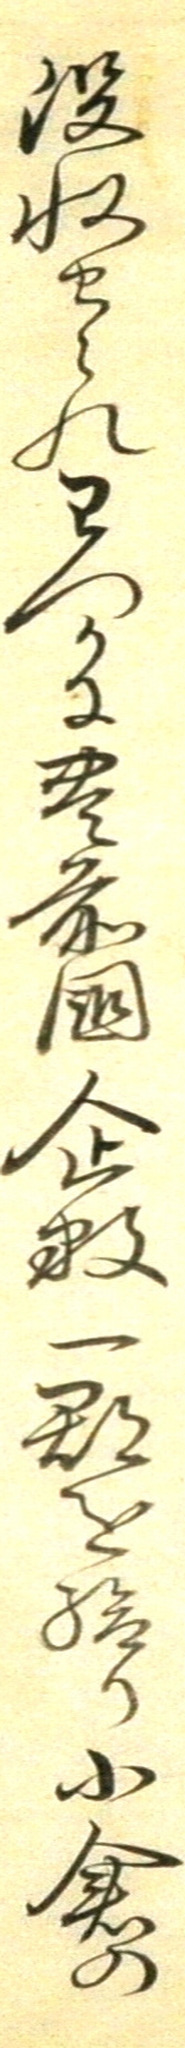没収せられわつかに豊前国企救一郡を給り小倉の
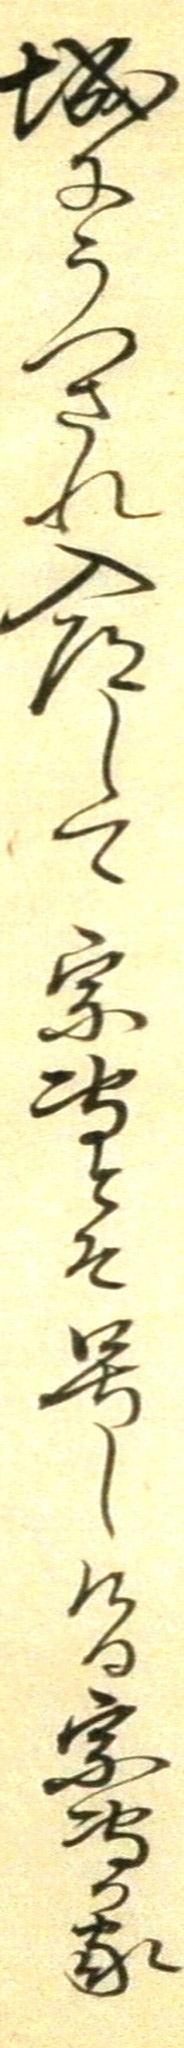城にうつされ入道して宗専とそ号しける宗専か家
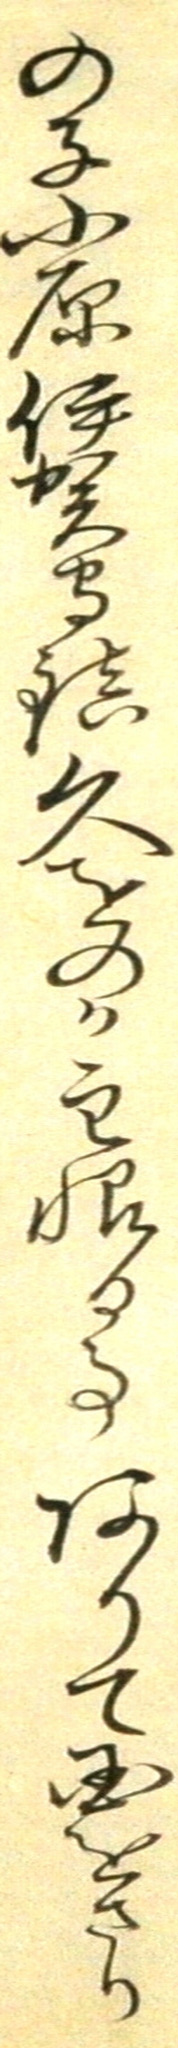の子小原伊賀守鎮久をのか主恨る事ありて国をさり
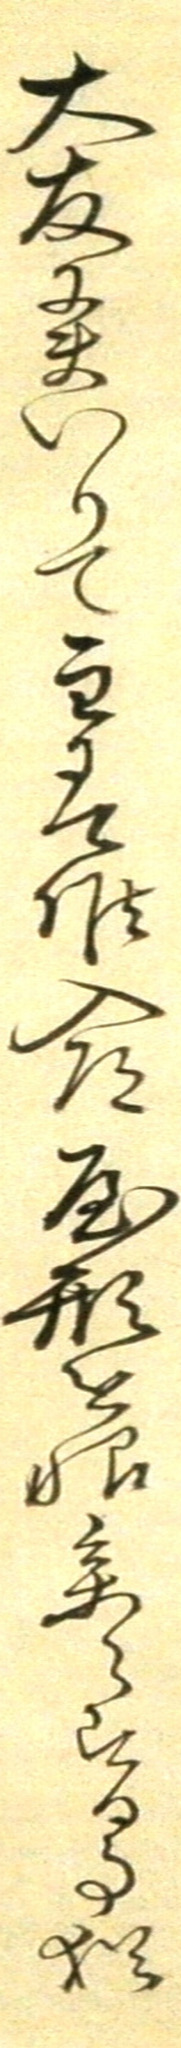大友にまいりて主にて候入道屋形を恨参らする事猶
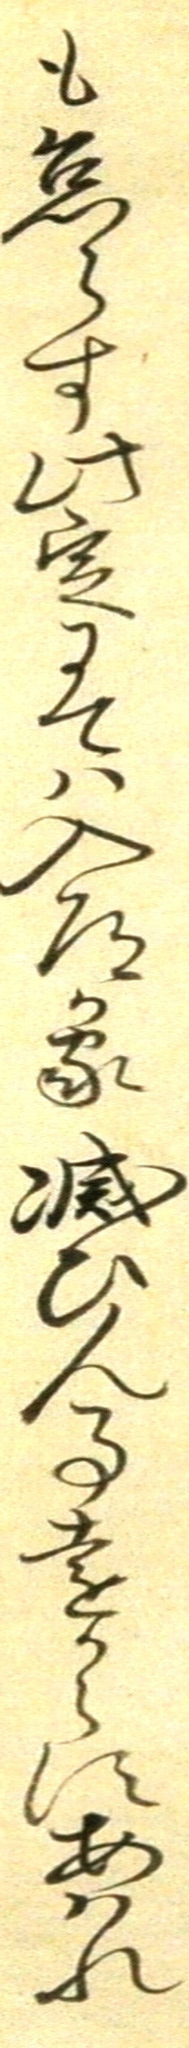も怠らす此定にては入道か家滅ひん事遠からすあはれ
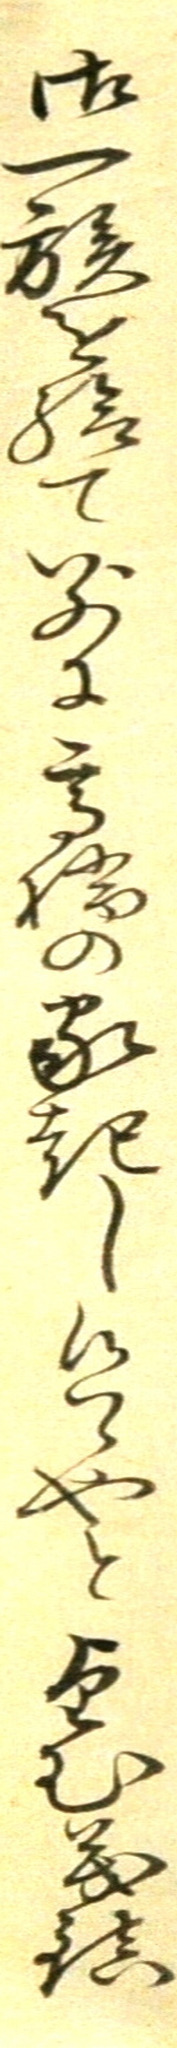御一族を給て別に高橋の家起し候はゝやと望む義鎮

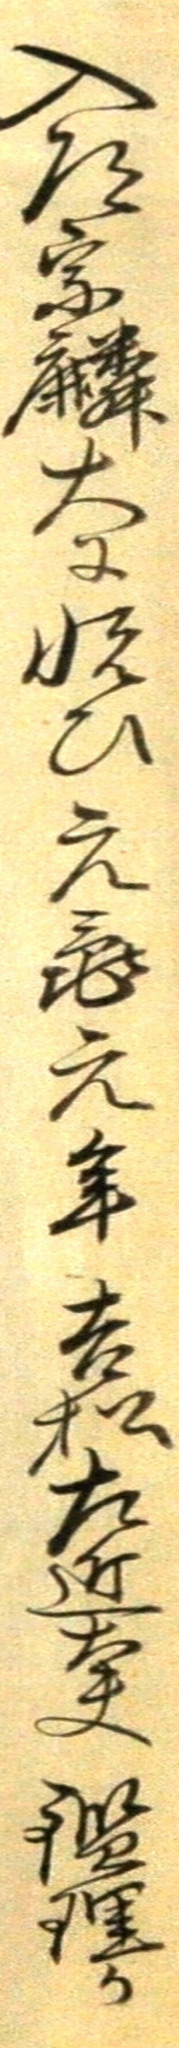入道宗麟大に悦ひ元亀元年吉松左近大夫鏡理か
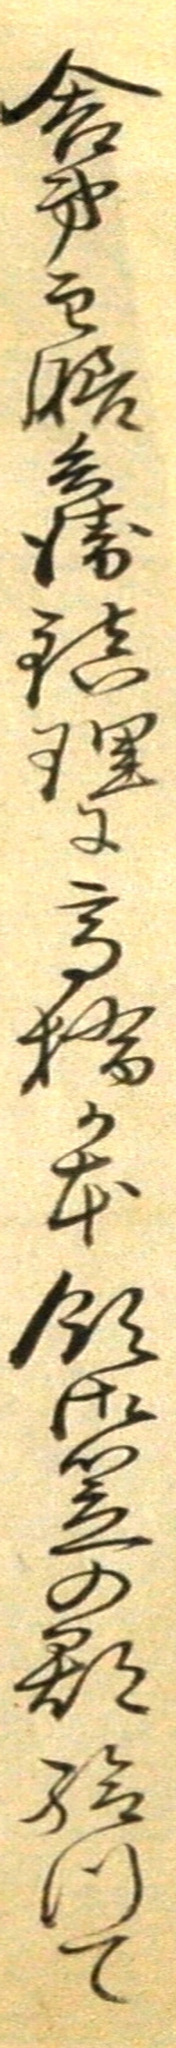舎弟主膳兵衛鎮理に高橋か本領御笠の郡給つて
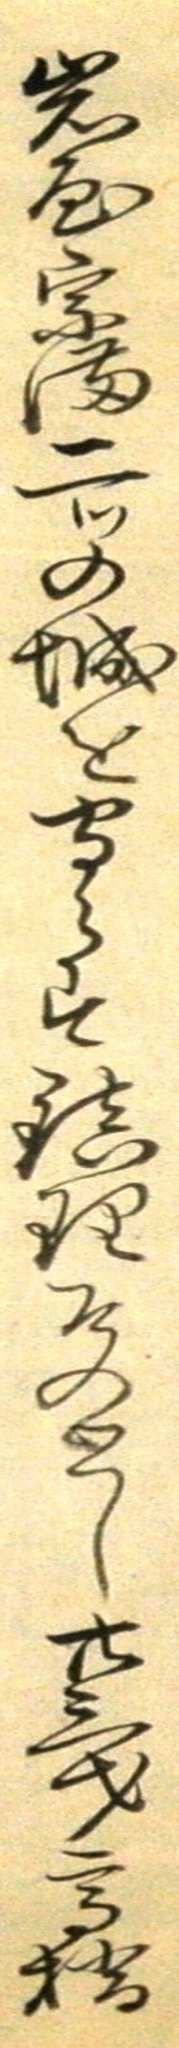岩屋宗満二ツの城を守らす鎮理そのとし二十三才高橋
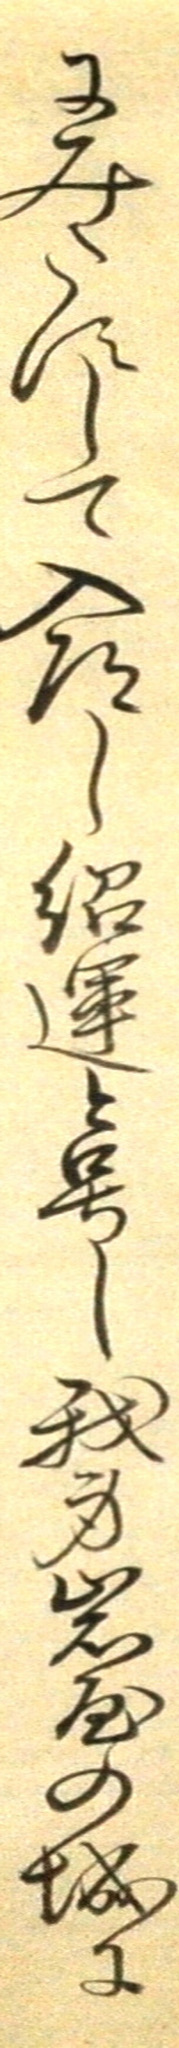にみたすして入道し紹運と号し我身岩屋の城に
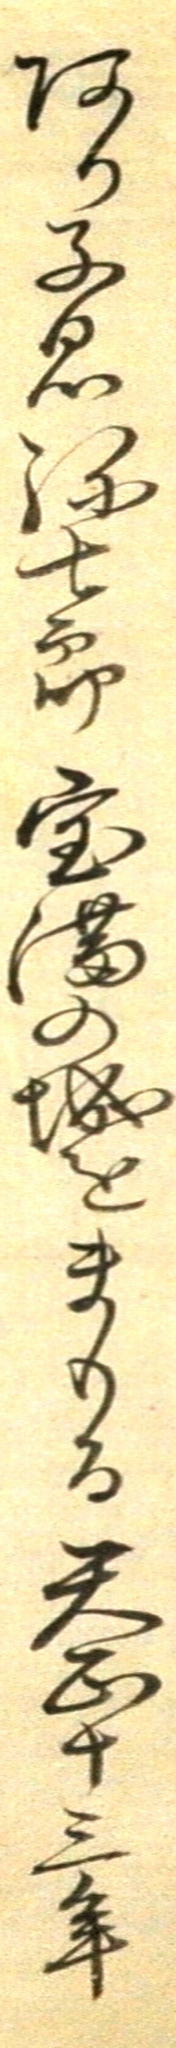あり子息弥七郎宝満の城をまもる天正十三年
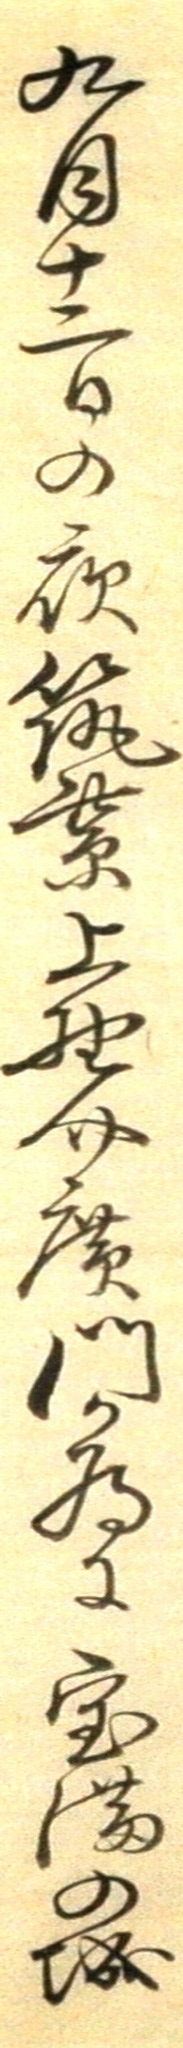九月十二日の夜筑紫上野介広門か為に宝満の城
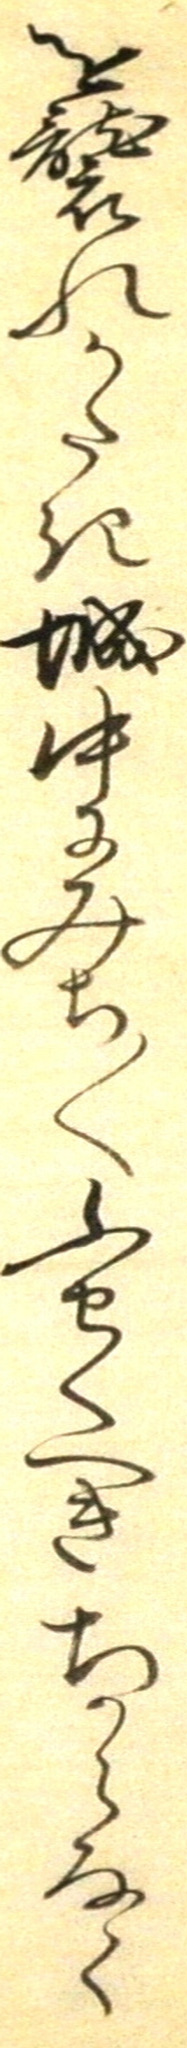を襲れかたき城中にみち〳〵ふせくへきちからなく
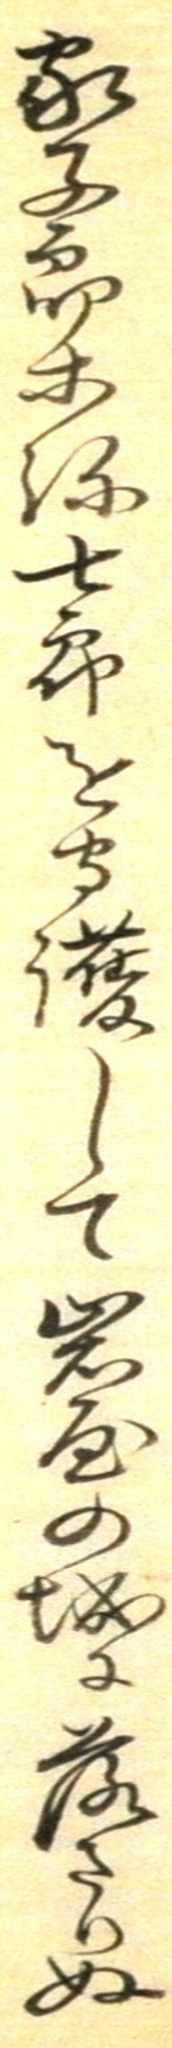家子郎等弥七郎を守護して岩屋の城に落さりぬ
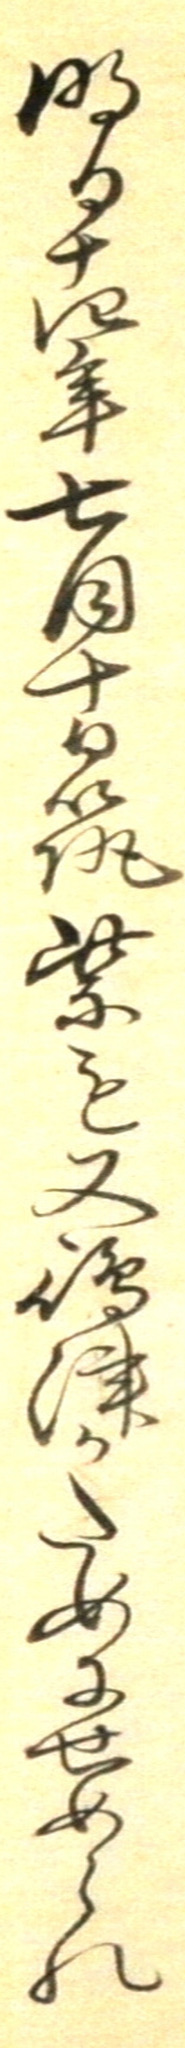明る十四年七月十日筑紫も又島津かためにせめられ
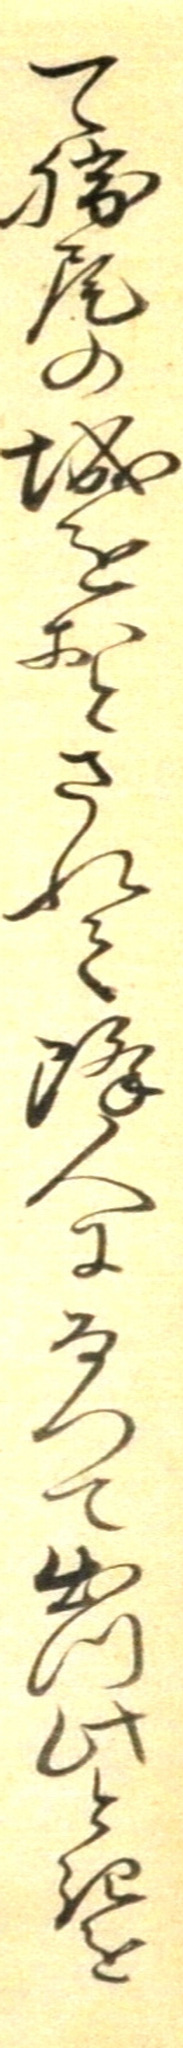て勝尾の城をおとされて降人になつて出川氏ときを
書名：藩翰譜（八・下）
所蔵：伊那市立高遠町図書館・合同会社AMANE
